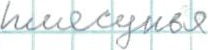плясунья
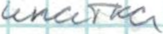ипатка
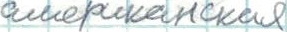американская
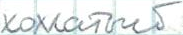хохлатый
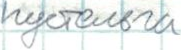пустельга
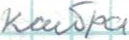кайра
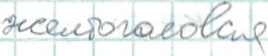желтоголовая
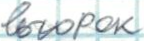вьюрок
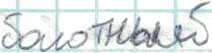болотный
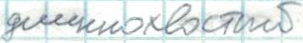длиннохвостый
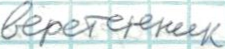веретенник
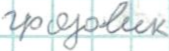грязовик
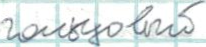гольцовый
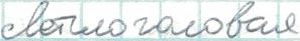светлоголовая
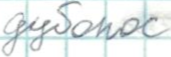дубонос
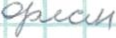орлан
